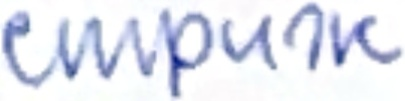стриж
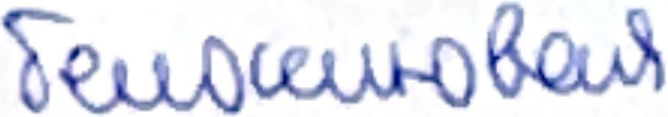белоклювая
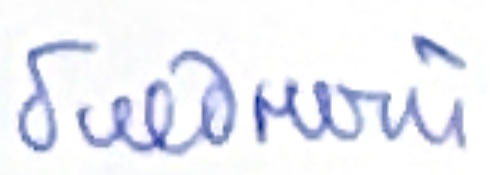бледный
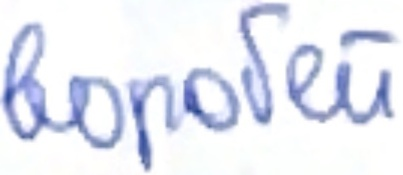воробей
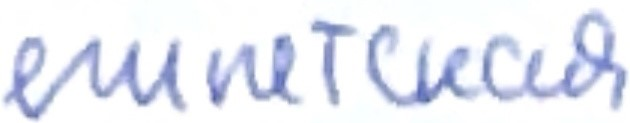египетская
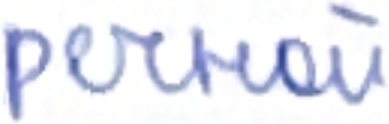речной
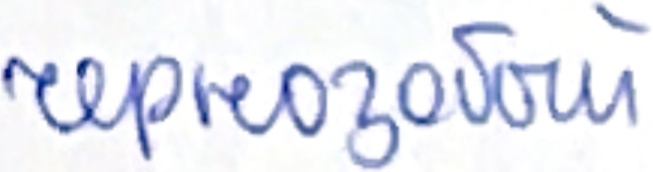чернозобый
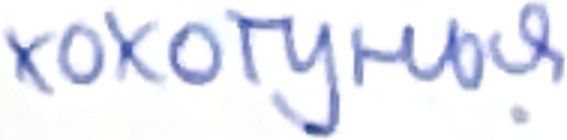хохотунья
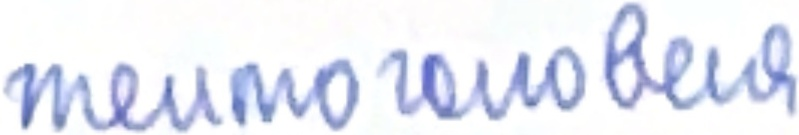телто голо вая
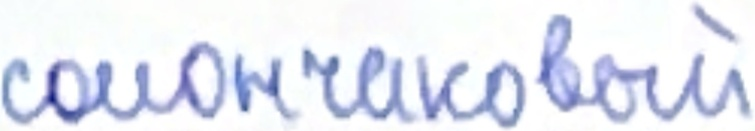солончаковый
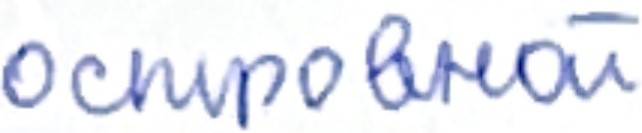островной
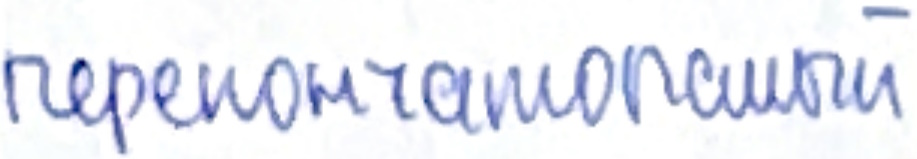перепончатопалый
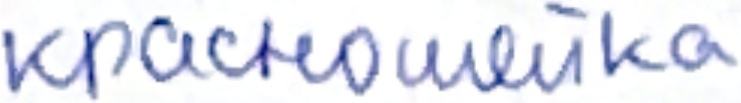красношейка
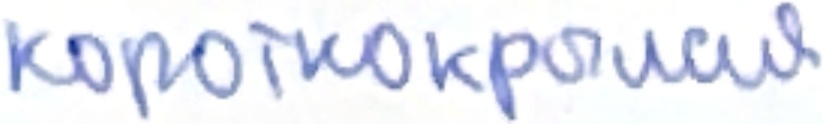короткокрылая
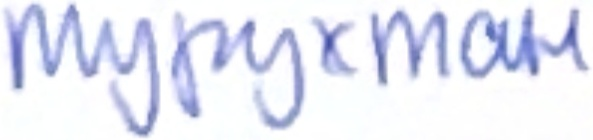турухтан
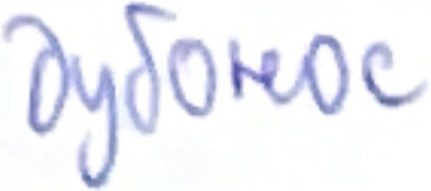дубонос
